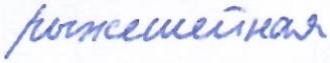рыжешейная
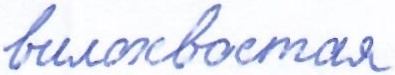вилохвостая
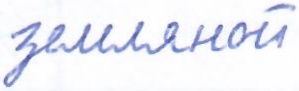земляной
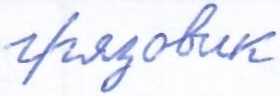грязовик
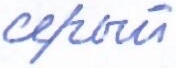серый
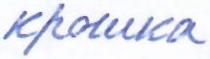крошка
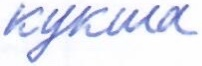кукша
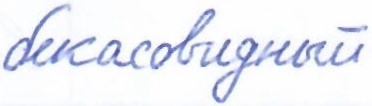бекасовидный
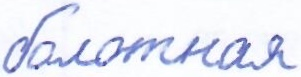болотная
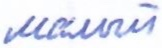малый
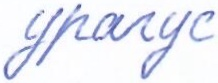урагус
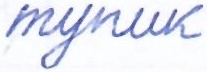тупик
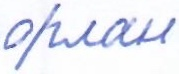орлан
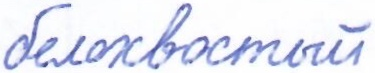белохвостый
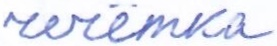чечётка
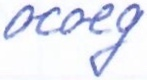осоед
